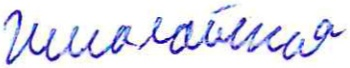гималайская
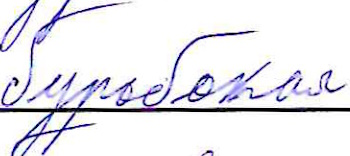буробокая
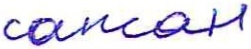сапсан
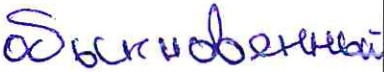обыкновенный
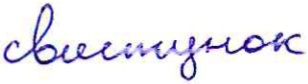свистунок
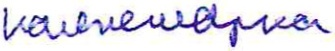калнешарка
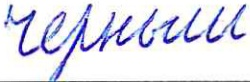черныш
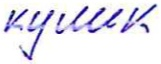кулик
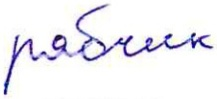рябчик
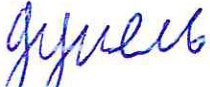дупель
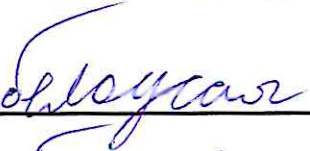белоусая
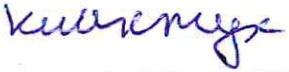клинтух
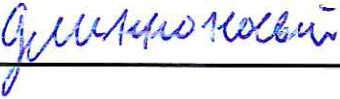длинноносый
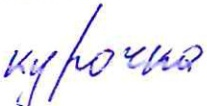курочка
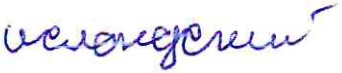ислондский
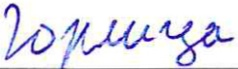горлица
